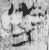受
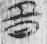○（期）
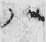八
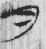月
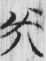癸
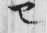巳
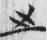之
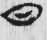日
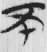不
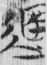𬨭（將）
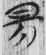昜（陽）
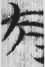大夫
